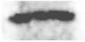一
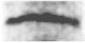一
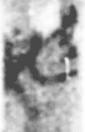○（戟）
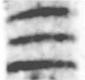三
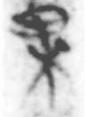果（戈）
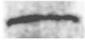一
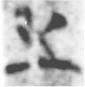之
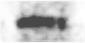一
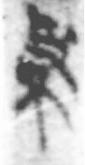杸
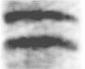二
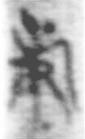旆
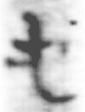屯
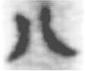八
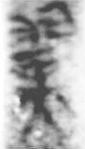翼
